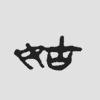姑
